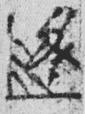○（拯）
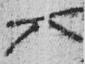亓（其）
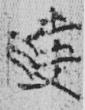○（隨）
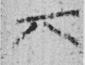亓（其）
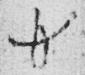心
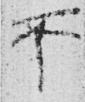不
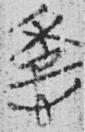悸
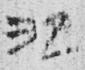九
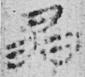晶
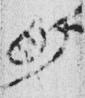艮
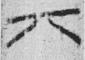亓（其）
